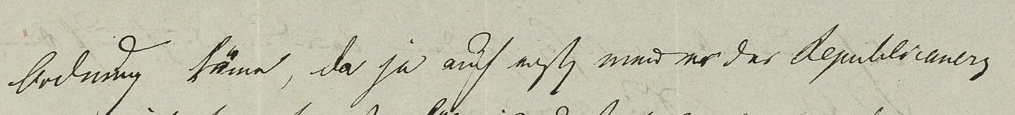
Ordnung käme, da ja auch erst, wenn er des Republicaners
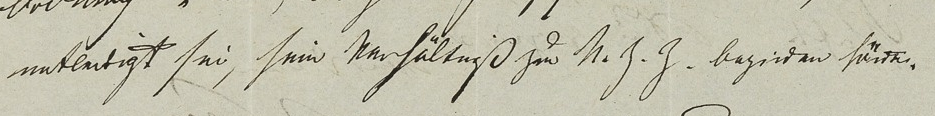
entledigt sei, sein Verhältniß zur N.Z.Z. beginnen könne.
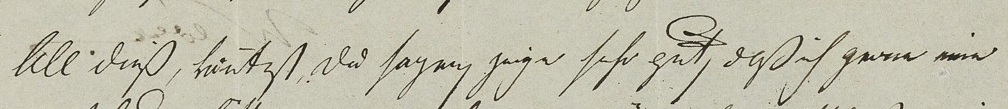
All dieß, könntest du sagen, zeige sehr gut, daß ich gerne eine
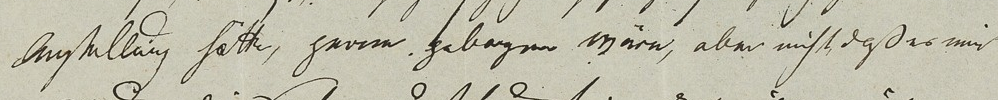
Anstellung hätte, gerne geborgen wäre, aber nicht, daß es mir
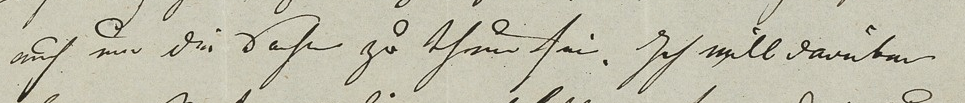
auch um die Sache zu thun sei. Ich will darüber
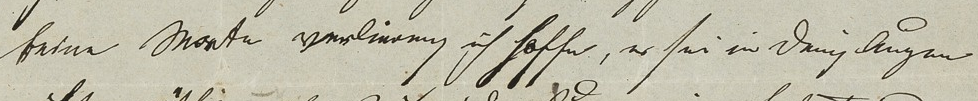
keine Worte verlieren, ich hoffe, es sei in deinen Augen
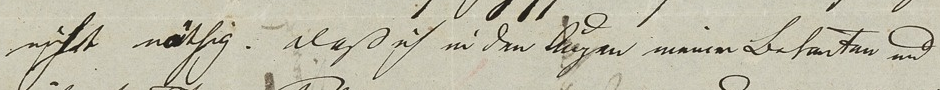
nicht nöthig. Daß ich in den Augen meiner Bekannten und
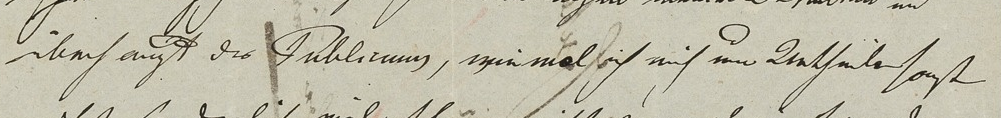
überhaupt des Publicums, wiewol ich mich um Urtheile sonst
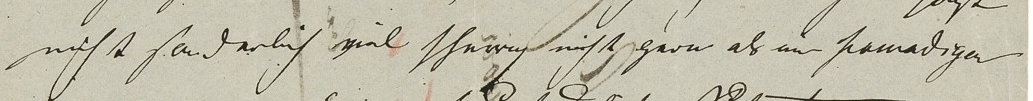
nicht sonderlich viel scheere, nicht gern als ein pomadiger
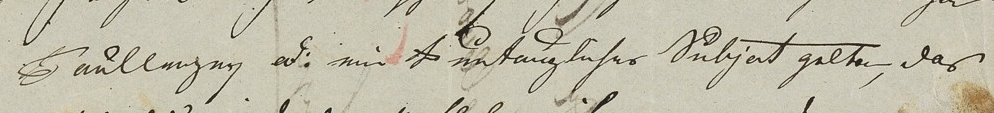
Faullenzer, od: ein untaugliches Subject gelte, das
